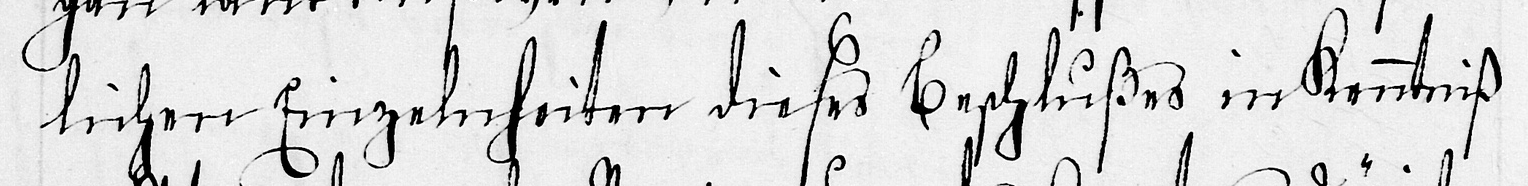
lichen Einzelnheiten dieses Beschlußes in Kenntniß
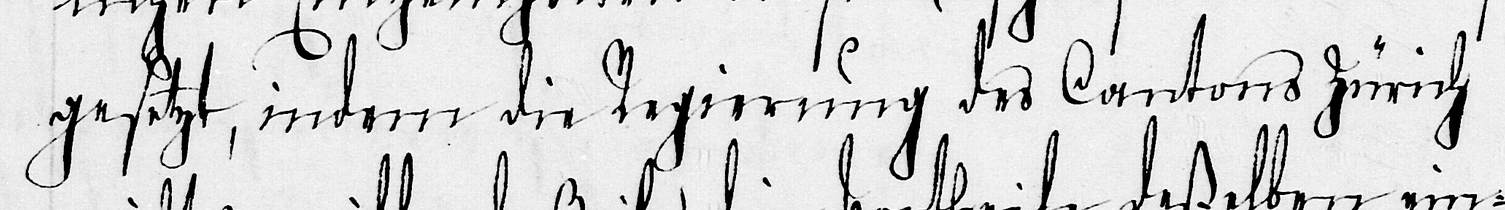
gesetzt, indem die Regierung des Cantons Zürich
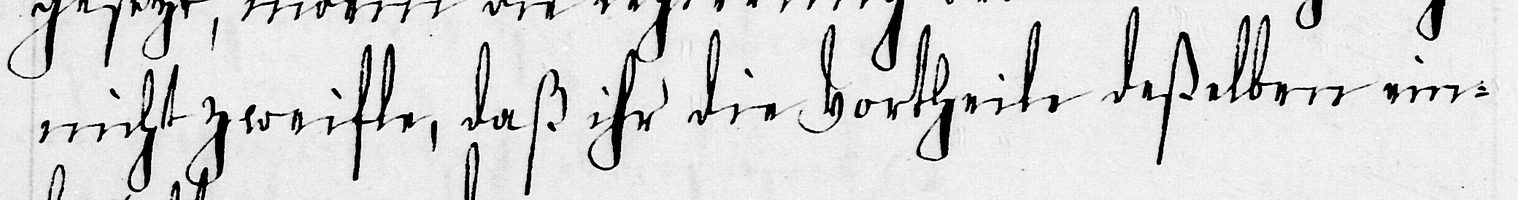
nicht zweifle, daß ihr die Vortheile deßelben ein¬
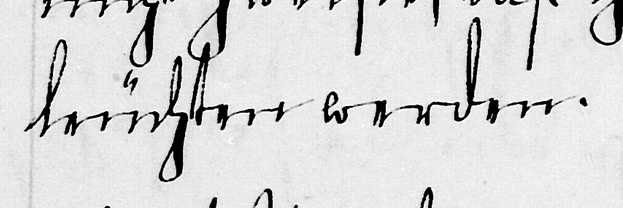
leuchten werden.
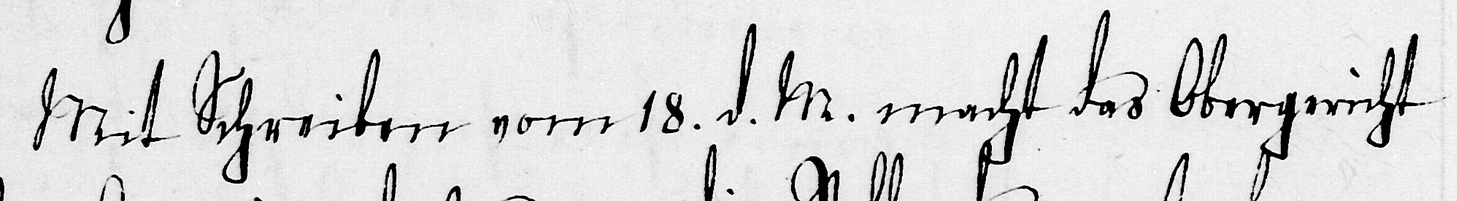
Mit Schreiben vom 18. d. M. macht das Obergericht
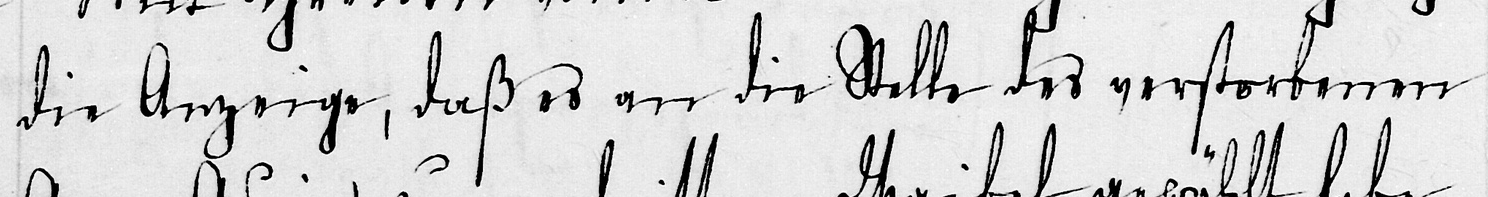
die Anzeige, daß es an die Stelle des verstorbenen
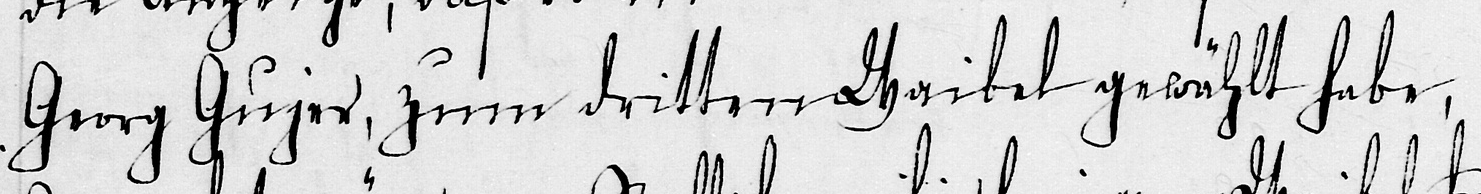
Georg Gujer, zum dritten Waibel gewählt habe,
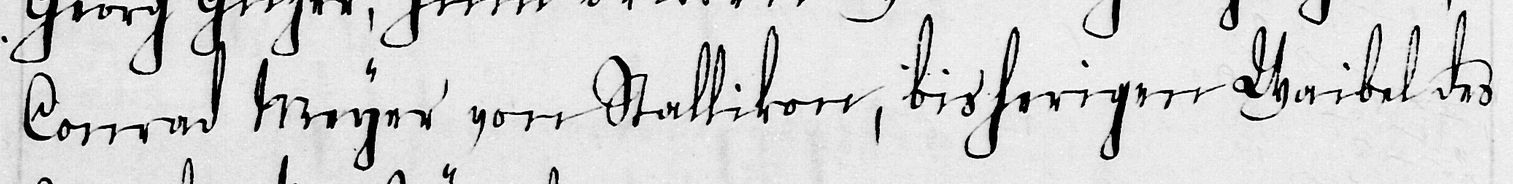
Conrad Meyer von Stallikon, bisherigen Waibel des
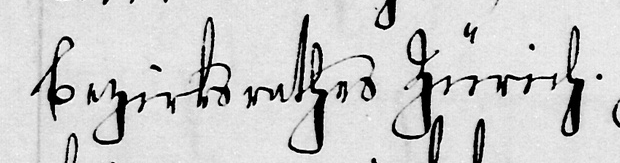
Bezirksrathes Zürich.
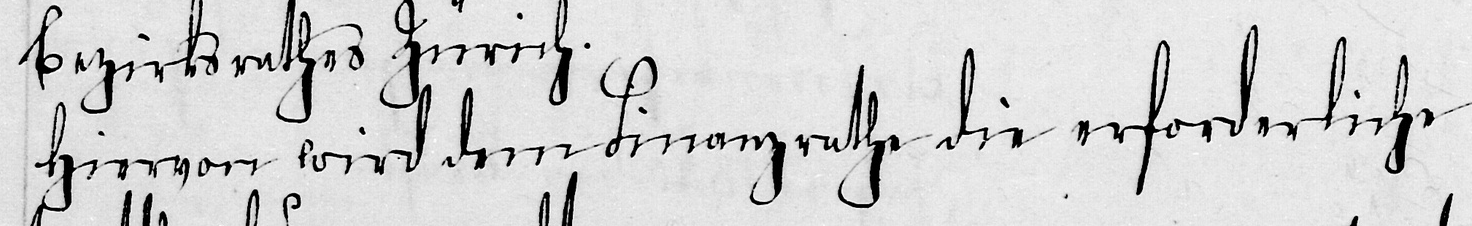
Hiervon wird den Finanzrathe die erforderliche
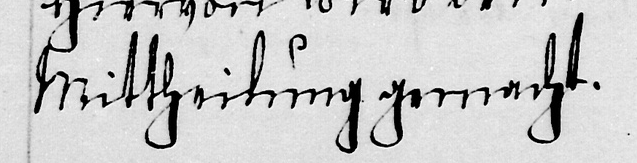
Mittheilung gemacht.
